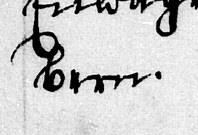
Bern.
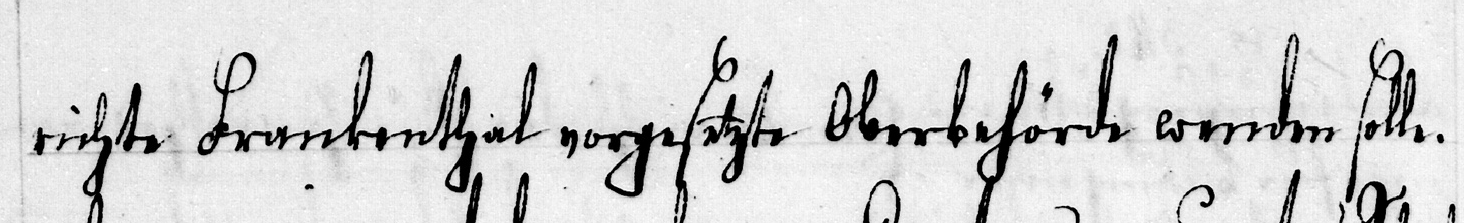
richte Frankenthal vorgesetzte Oberbehörde wenden sol¬
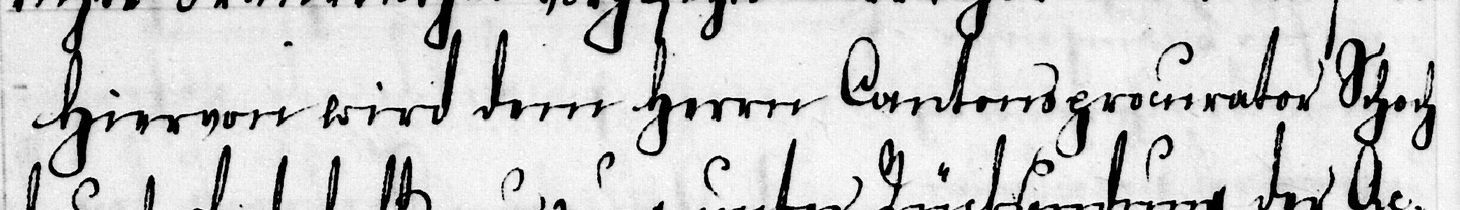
Hiervon wird dem Herrn Cantonsprocurator Schoch
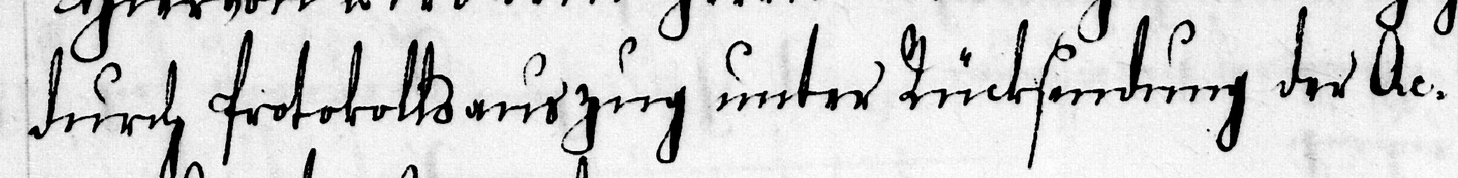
durch Protokollsauszug unter Rücksendung der Ac¬
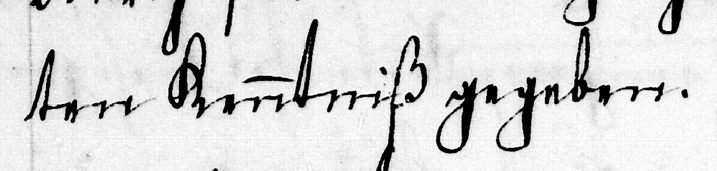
ten Kenntniß gegeben.
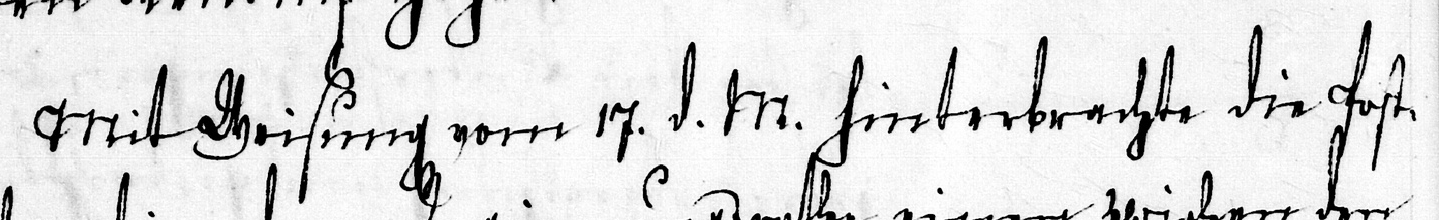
Mit Weisung vom 17. d. M. hinterbrachte die Post¬
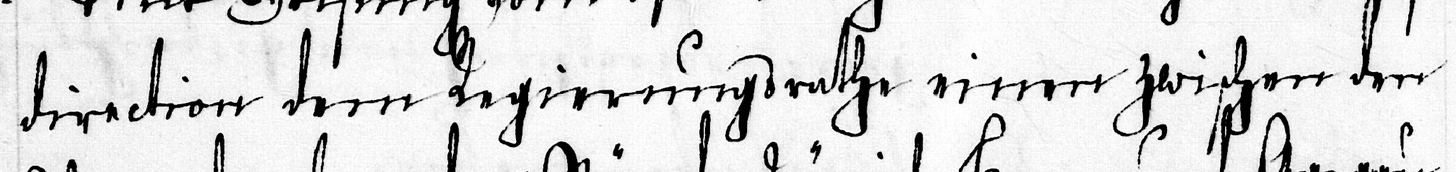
direction dem Regierungsrathe einen zwischen den
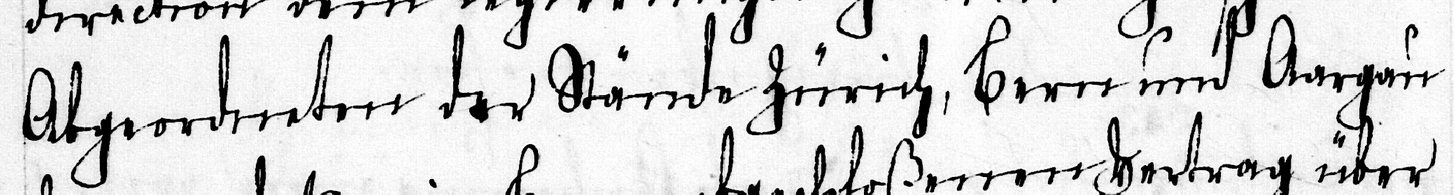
Abgeordneten der Stände Zürich, Bern und Aargau
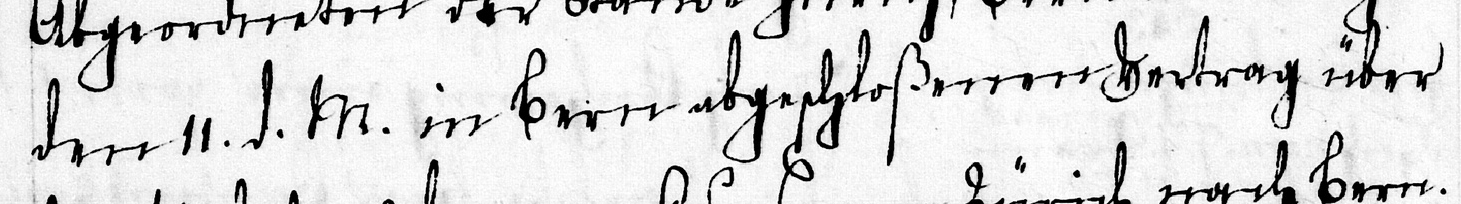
den 11. d. M. in Bern abgeschloßenen Vertrag über
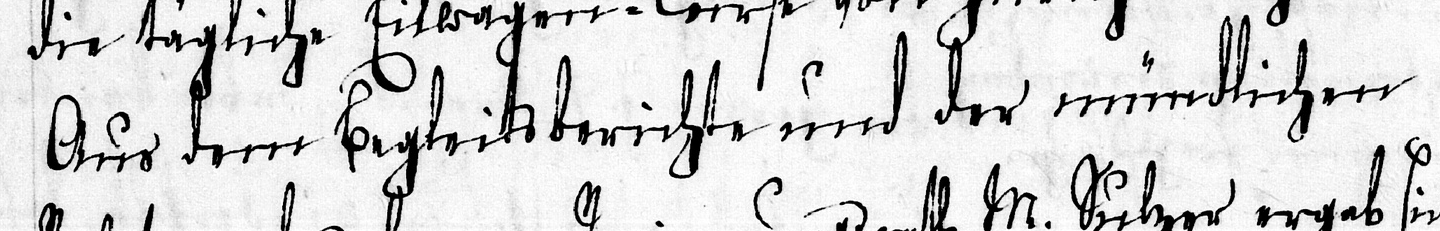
Aus dem Begleitsberichte und der mündlichen
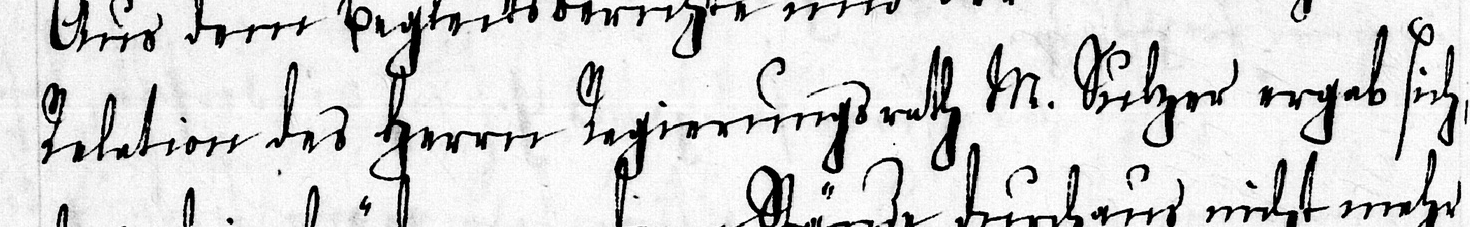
Relation des Herrn Regierungsrath M. Sulzer ergab sic¬
